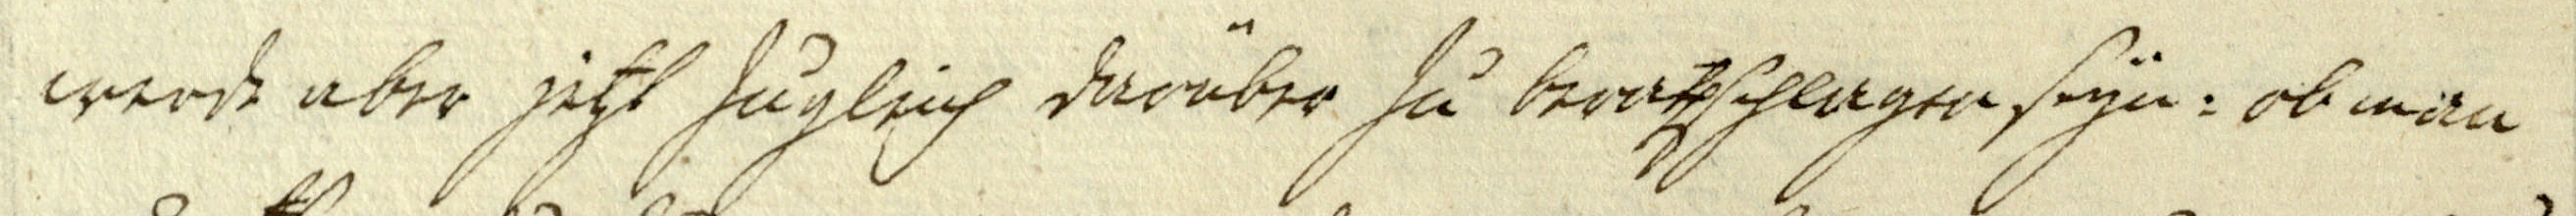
werde aber jetzt zugleich darüber zu berathschlagen seÿn: ob man
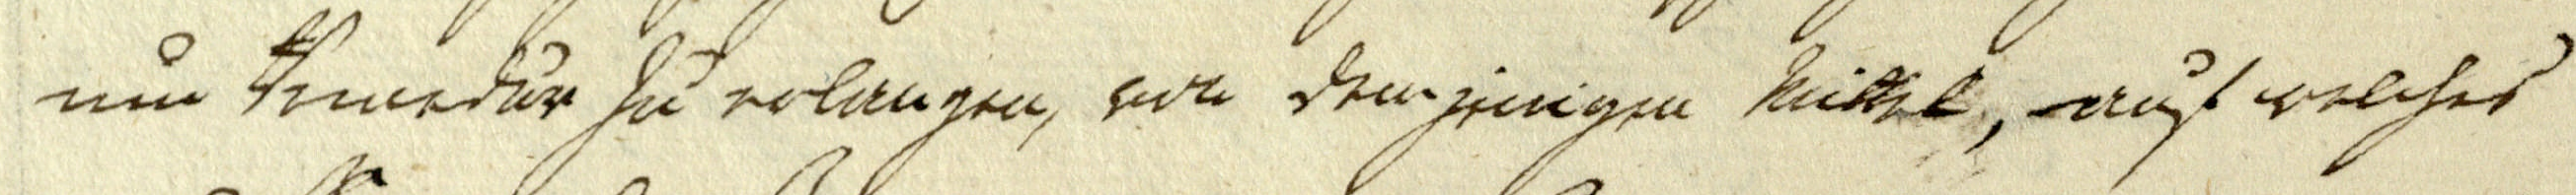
um Remedur zu erlangen, von demjenigen Mittel, auf welches
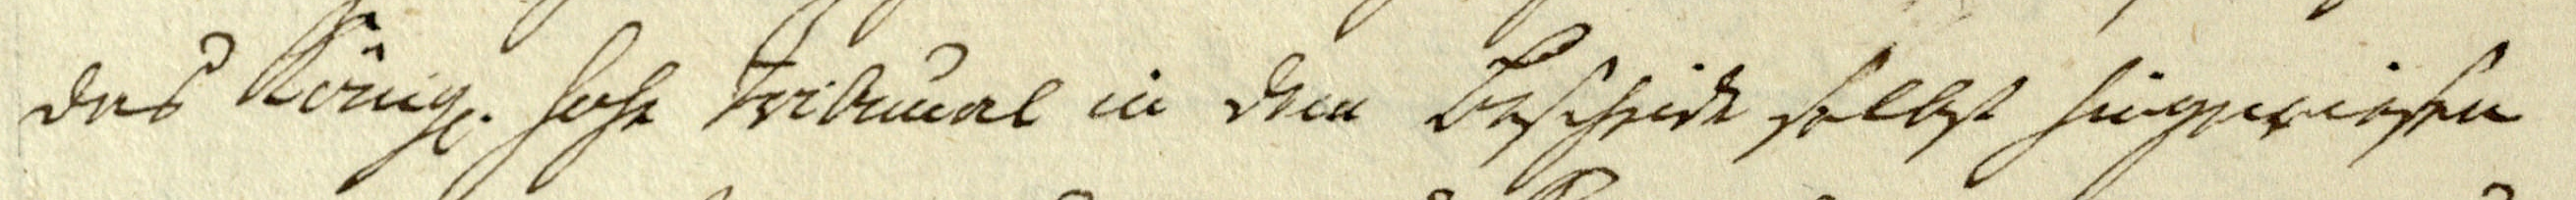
das Köngil. hohe Tribunal in dem Bescheide selbst hingewiesen
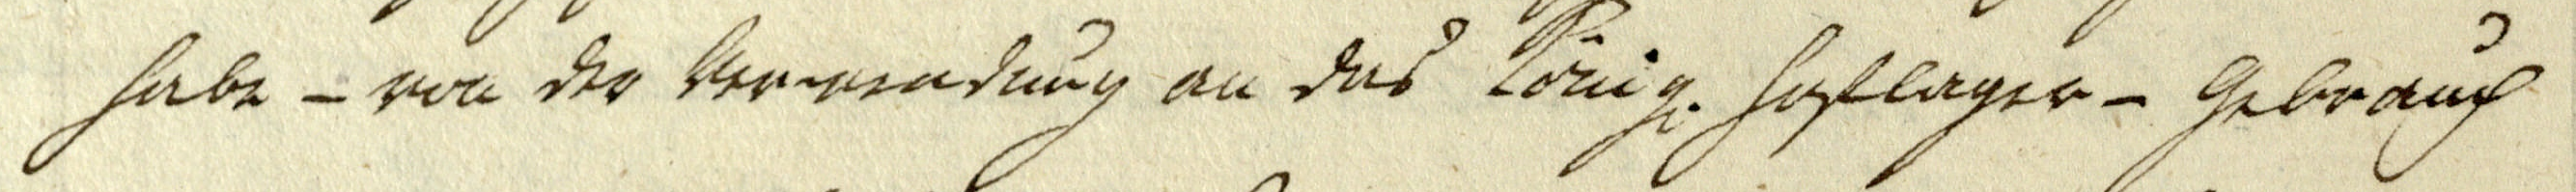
habe - von der Verwendung an das Königl. hoflager - Gebrauch
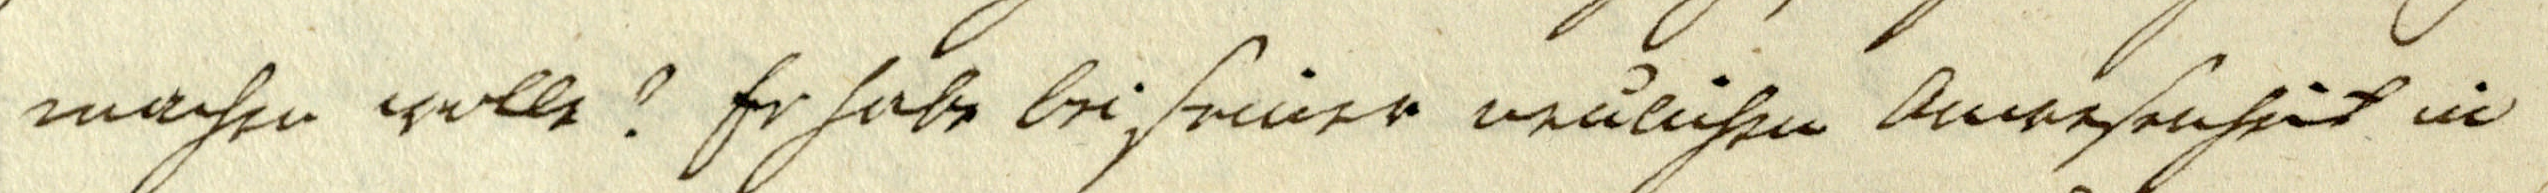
machen wolle? Er habe bei seiner neulichen Anwesenheit in
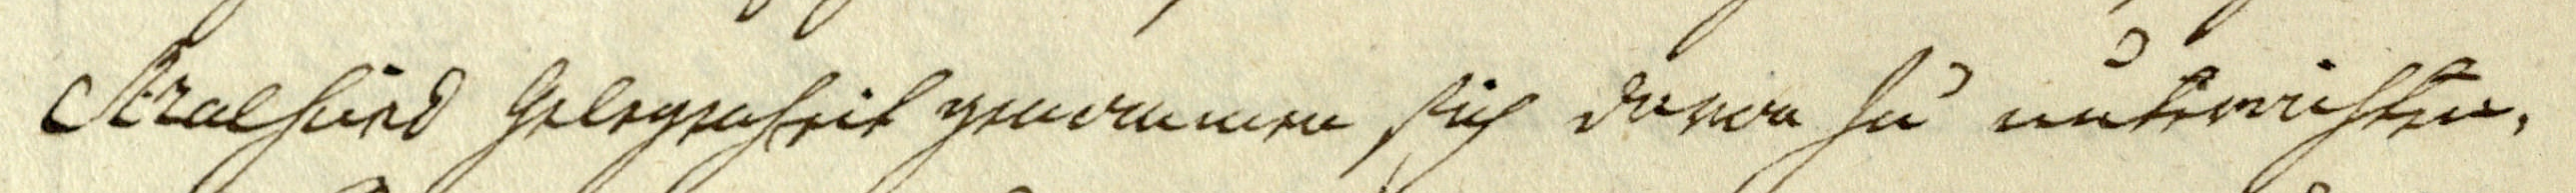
Stralsund Gelegenheit genommen sich davon zu unterrichten,
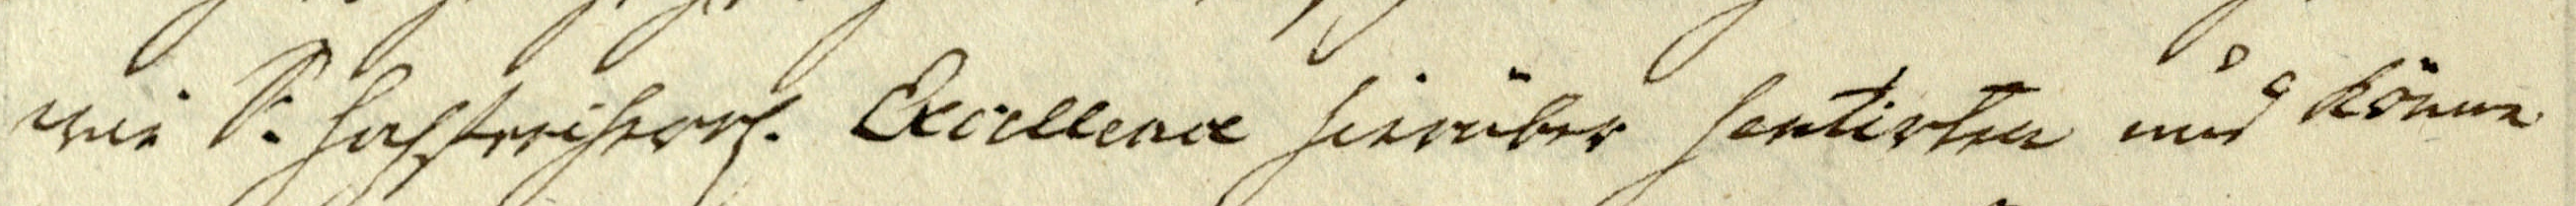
wie Sr. hochfreiherrl. Excellence hierüber sentirten und könne
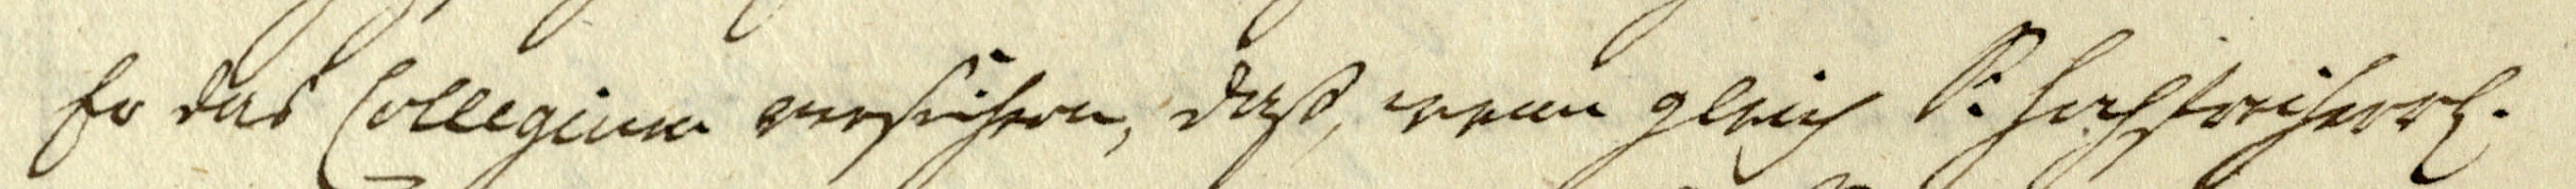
Er das Collegium versichern, daß wenn gleich Sr. hochfreiherrl.
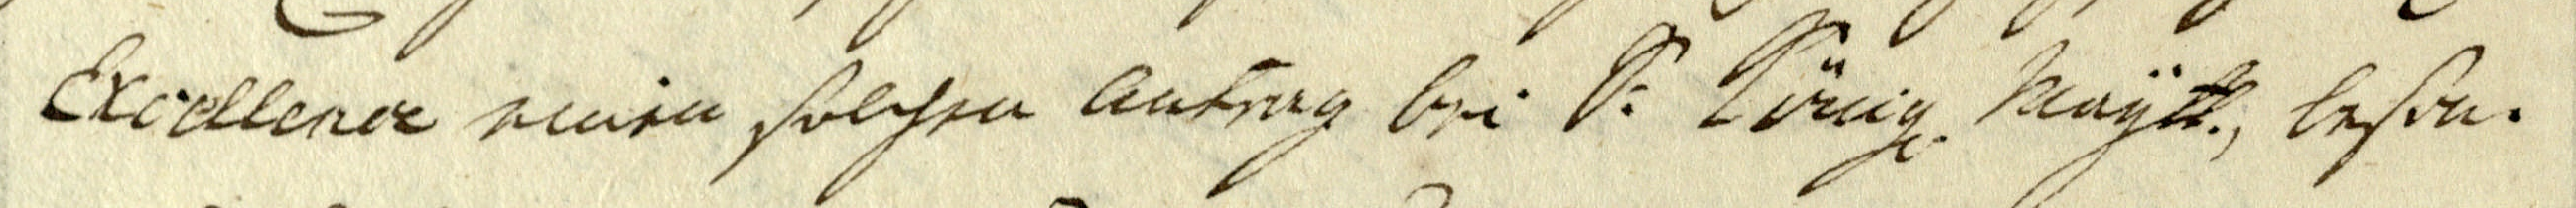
Excellence einen solchen Antrag bei Sr. Königl. Maÿtt. beson¬
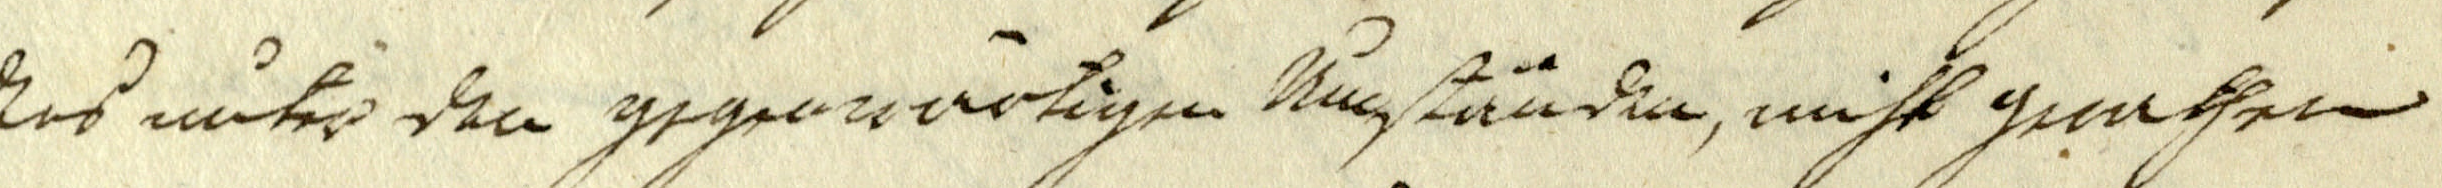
ders unter den gegenwärtigen Umständen, nicht gerathen
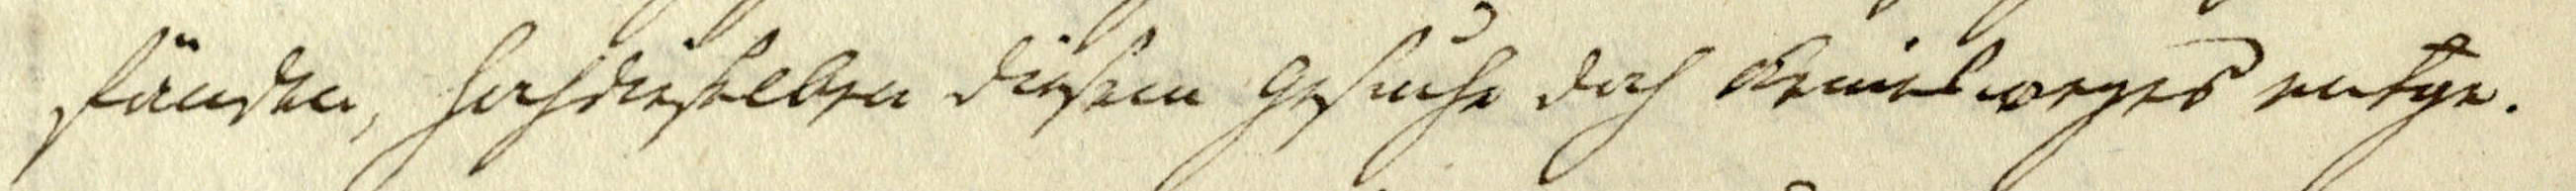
fänden, hochdieselben diesem Gesuche doch keinesweges entge¬
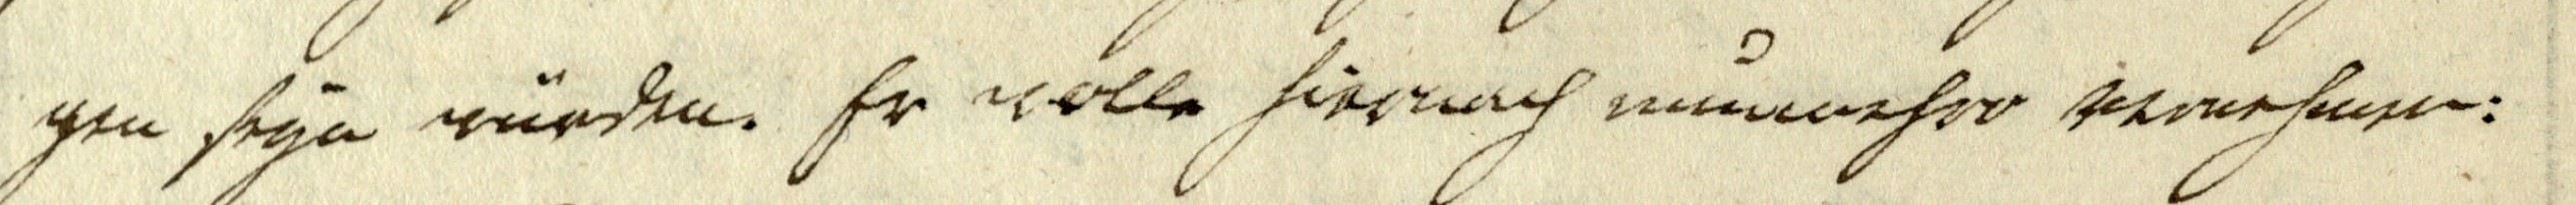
gen seÿn würden. Er wolle hiernach nunmehro vernehmen:
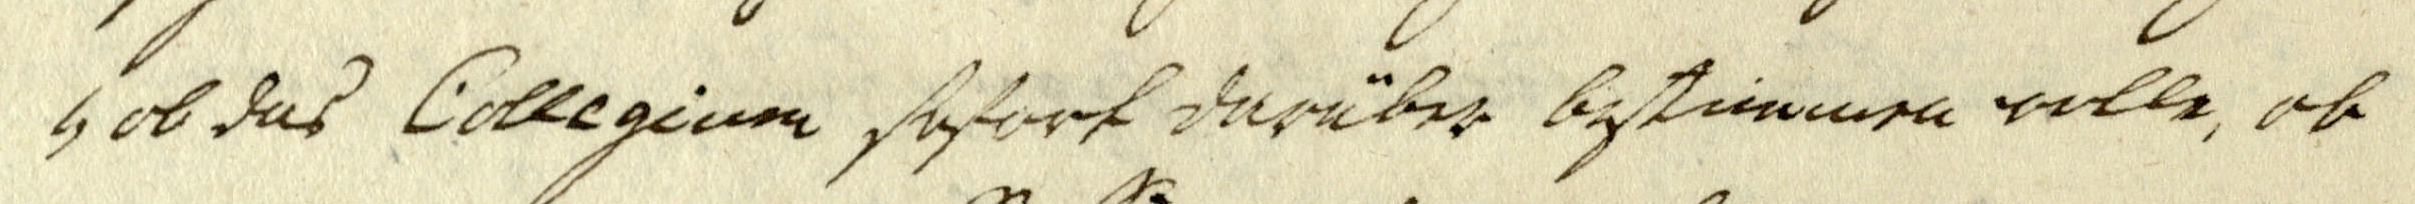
1, ob das Collegium sofort darüber bestimmen wolle, ob
